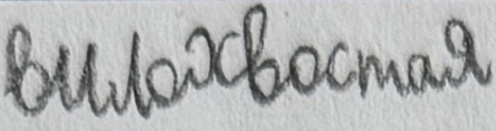вилохвостая
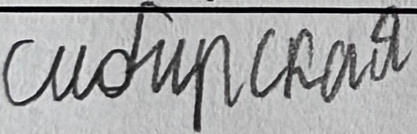сибирская
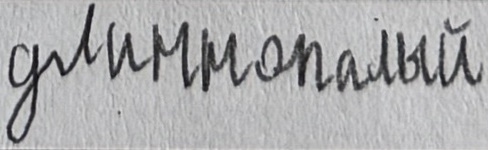длиннопалый
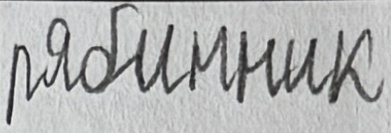рябинник
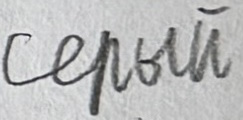серый
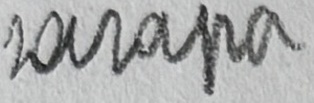гагара
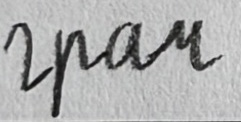грач
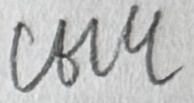сыч
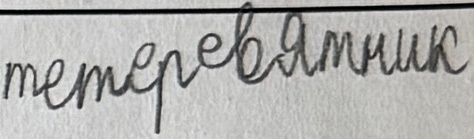тетеревятник
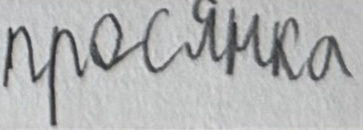просянка
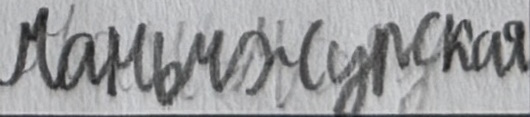маньчжурская
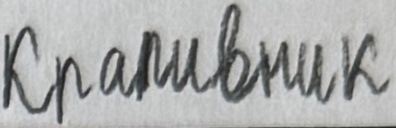крапивник
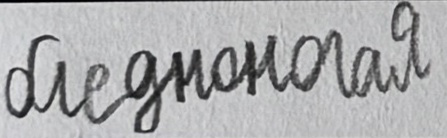бледноногая
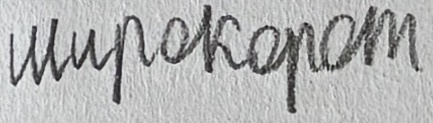широкорот
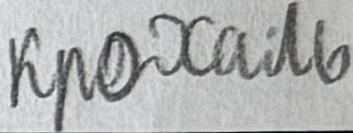крохаль
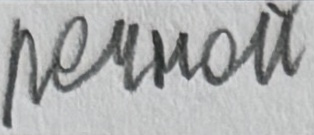речной
